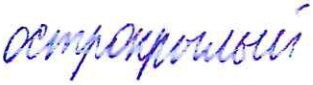острокрылый
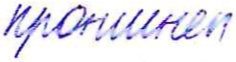кроншнеп
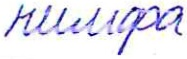нимфа
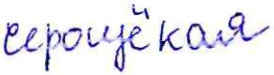серощёкая
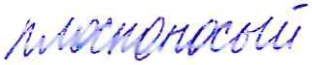плосконосый
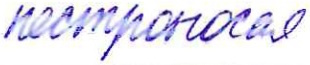пестроносая
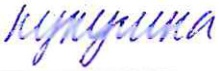кукушка
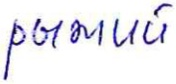рыжий
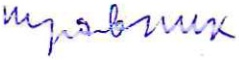травник
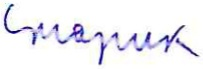старик
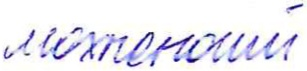мохноногий
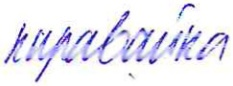каравайка
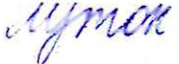луток
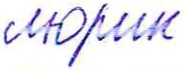люрик
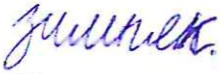зимняк
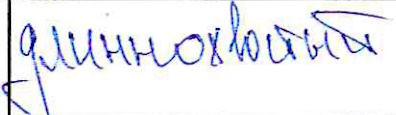длиннохвостый
